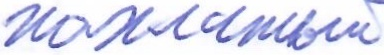хохлатый
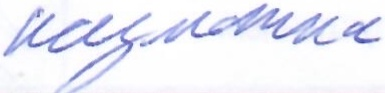науманна
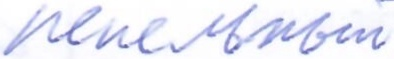пепельный
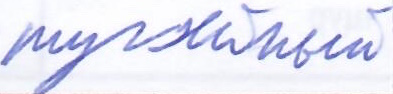тугайный
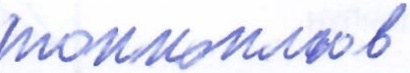тонкоклюв
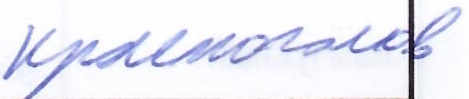красноголов
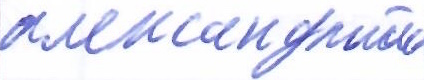александрийс
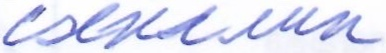сахалин
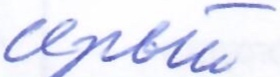серый
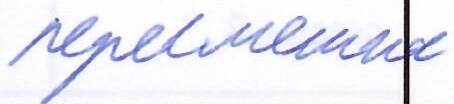пересмешка
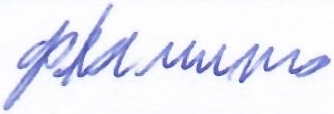фламинго
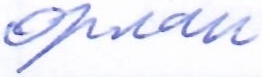орлан
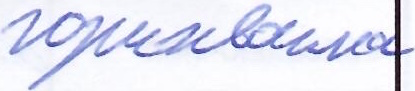горихванка
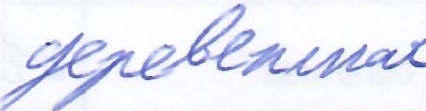деревенсная
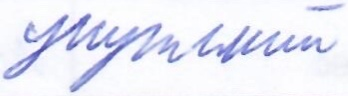укутский
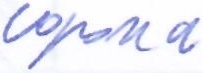сорока
